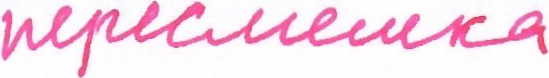пересмешка
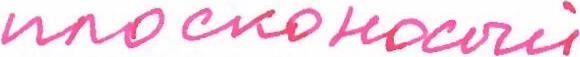плосконосый
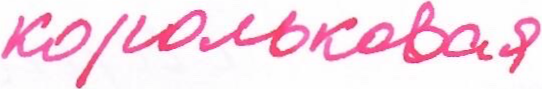корольковая
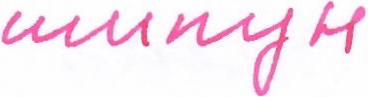шипун
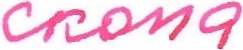скопа
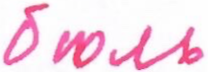бюль
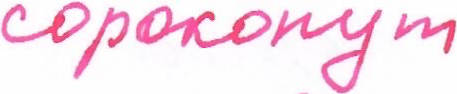сорокопут
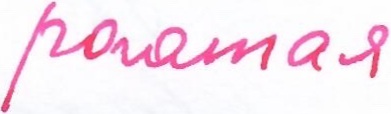рогатая
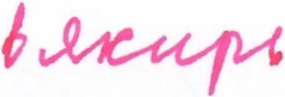вяхирь
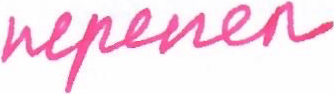перепел
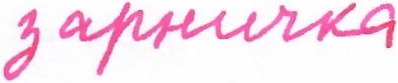зарничка
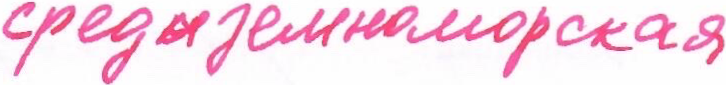средиземноморская
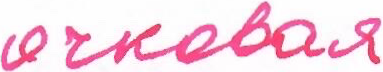очковая
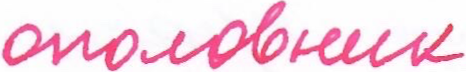ополовник
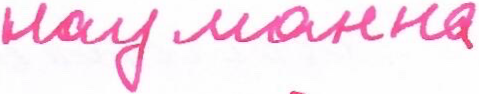науманна
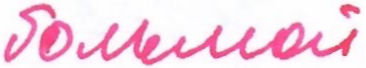большой
